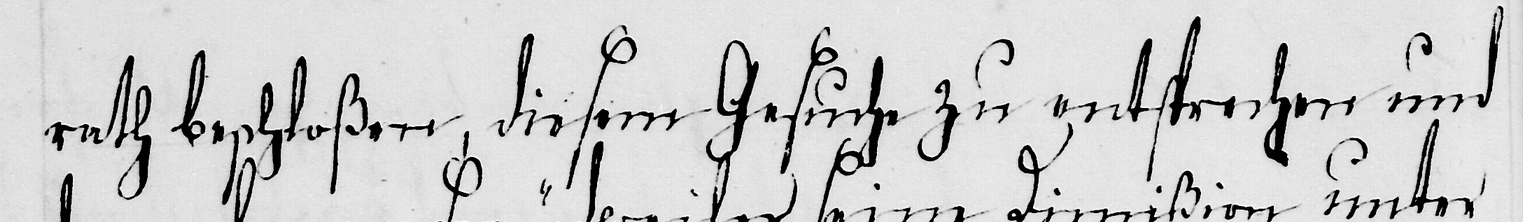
rath beschloßen, diesem Gesuche zu entsprechen und
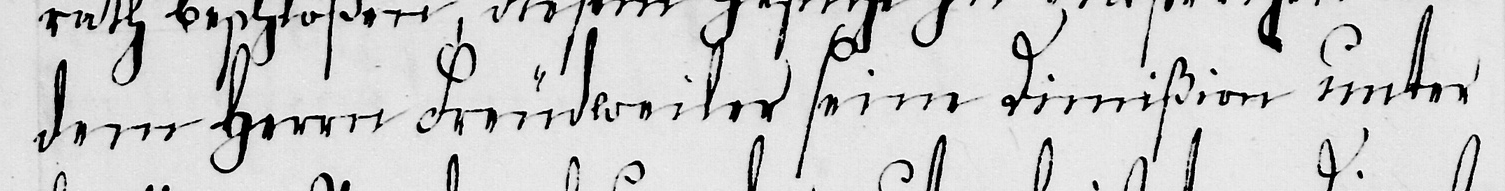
dem Herrn Freudweiler seine Dimißion unter
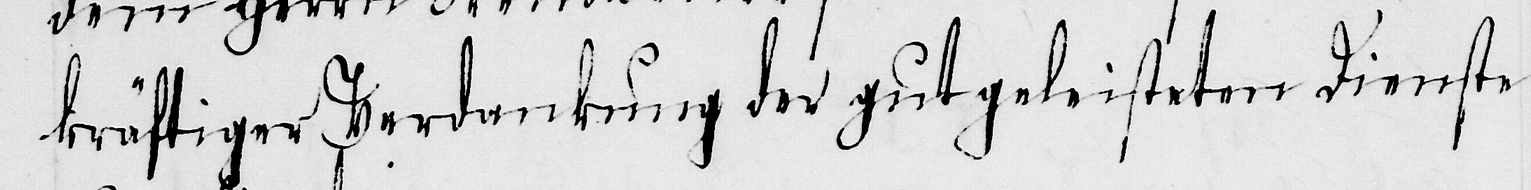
kräftiger Verdankung der gut geleisteten Dienste
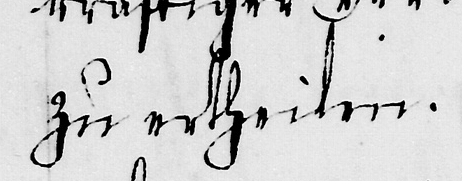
zu ertheilen.
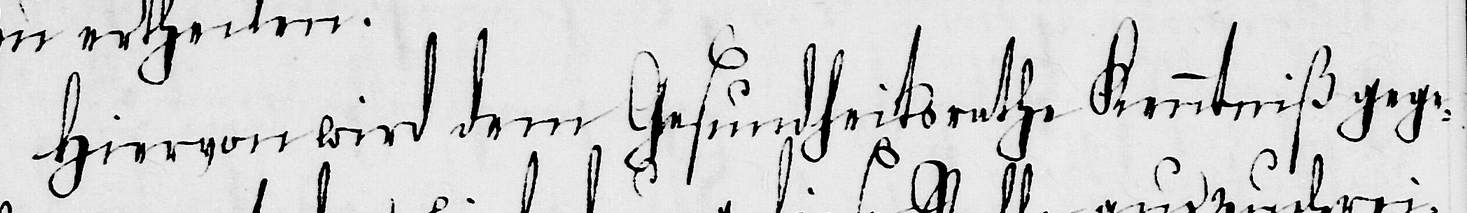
Hiervon wird dem Gesundheitsrathe Kenntniß gege¬
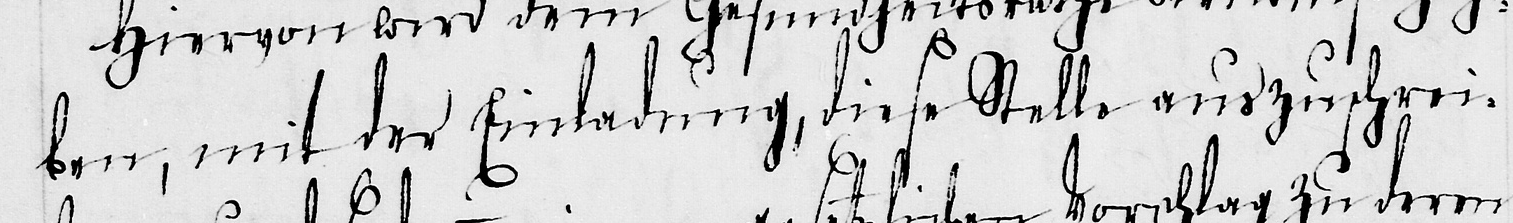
ben, mit der Einladung, diese Stelle auszuschrei¬
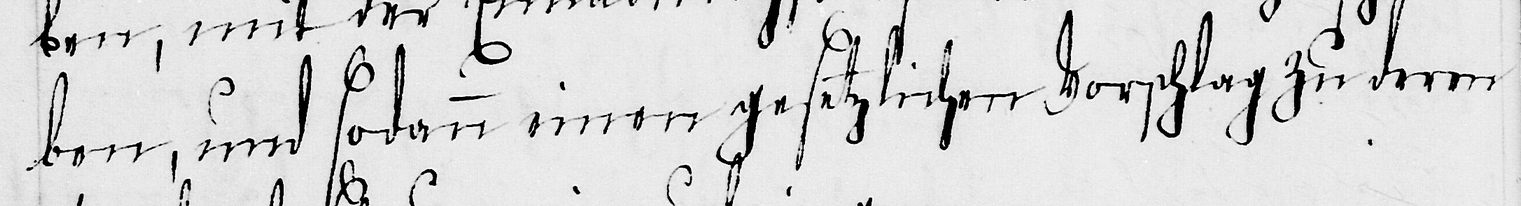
ben, und sodann einen gesetzlichen Vorschlag zu deren
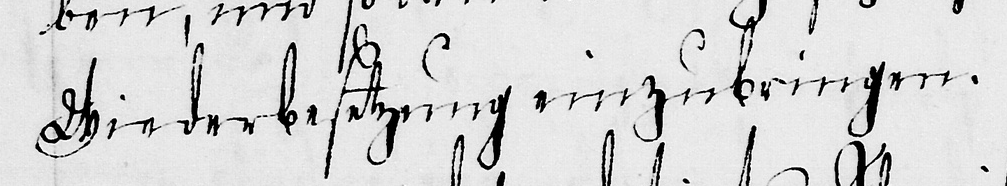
Wiederbesetzung einzubringen.
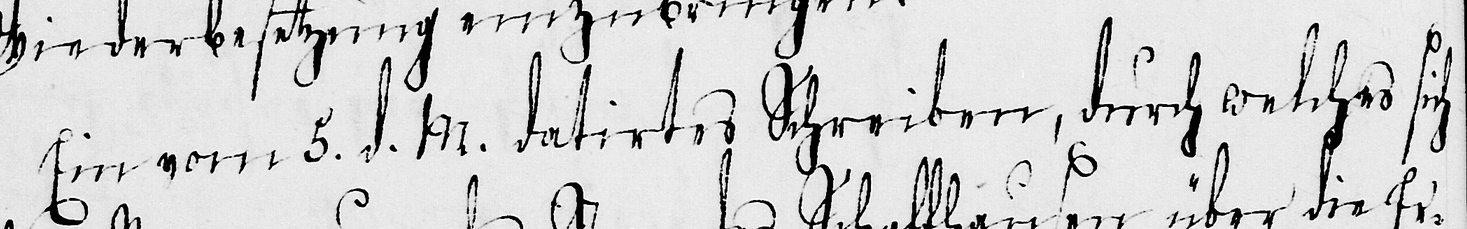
Ein vom 5. d. M. datirtes Schreiben, durch welches si¬
